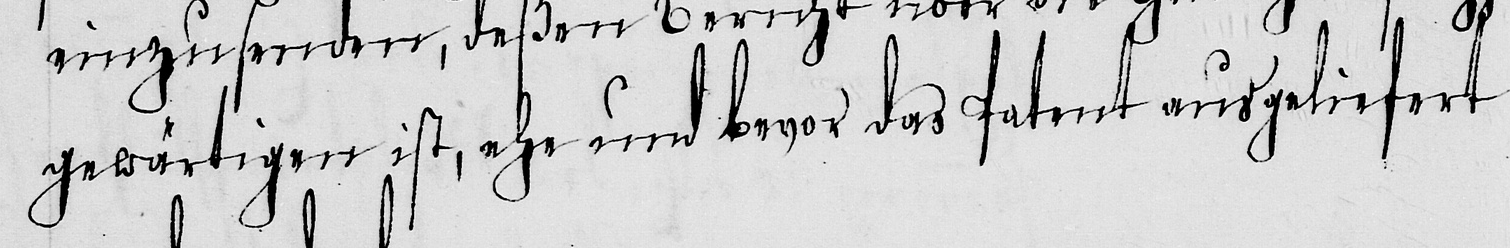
gewärtigen ist, ehe und bevor das Patent ausgeliefert
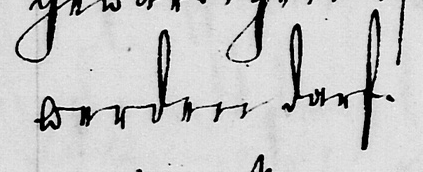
werden darf.
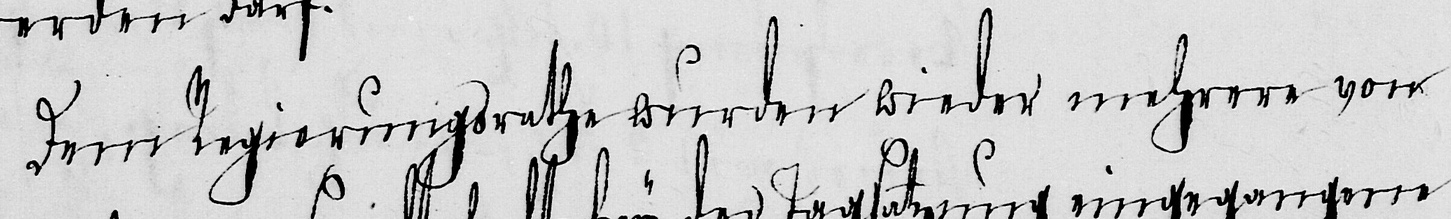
Dem Regierungsrathe wurden wieder mehrere von
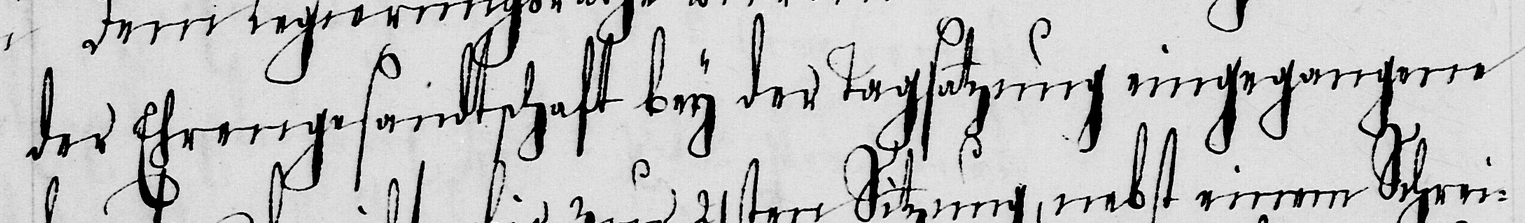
der Ehrengesandtschaft bey der Tagsatzung eingegangene
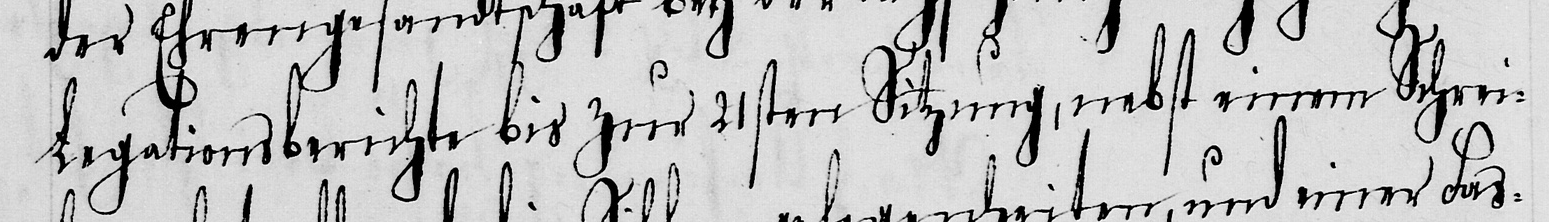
Legationsberichte bis zur 21sten Sitzung, nebst einem Schrei¬
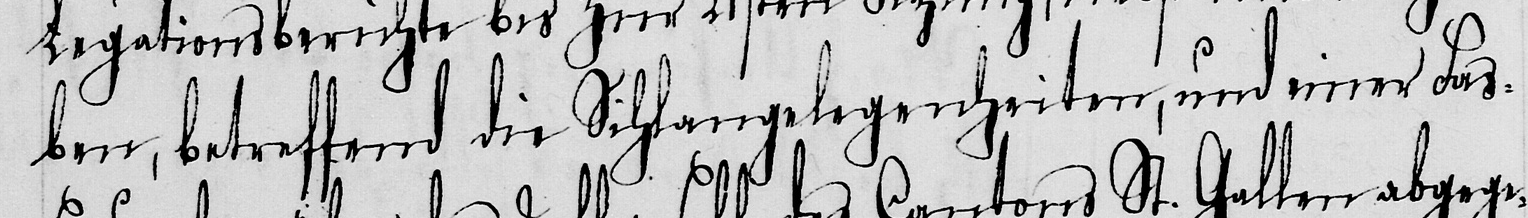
ben, betreffend die Sihlangelegenheiten, und einer Faß¬
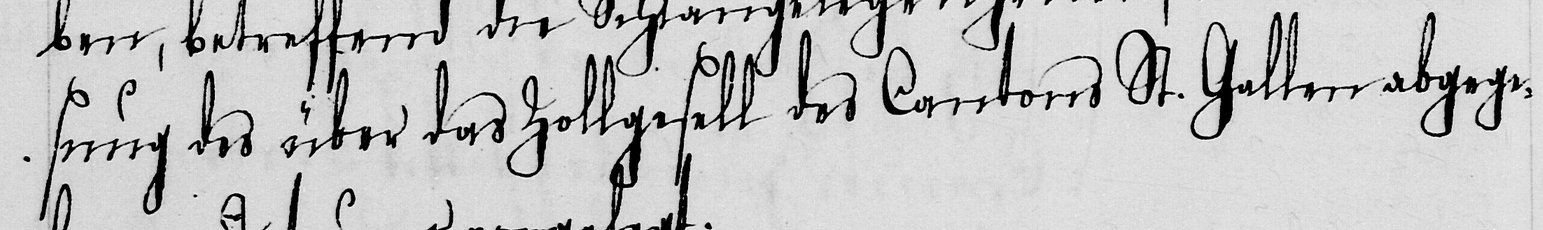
ung des über das Zollgesell des Cantons St. Gallen abgege¬
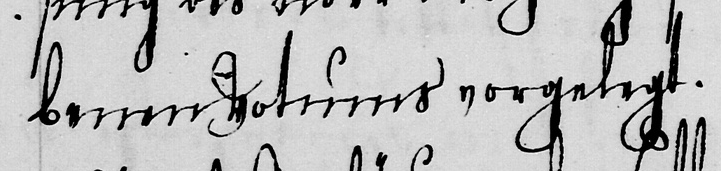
benen Votums vorgelegt.
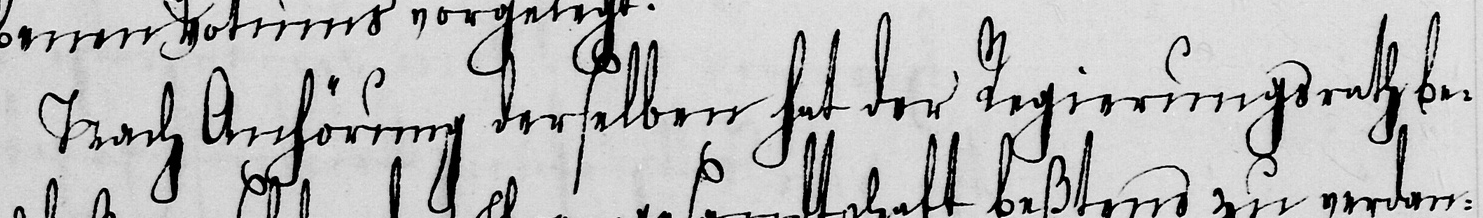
Nach Anhörung derselben hat der Regierungsrath be¬
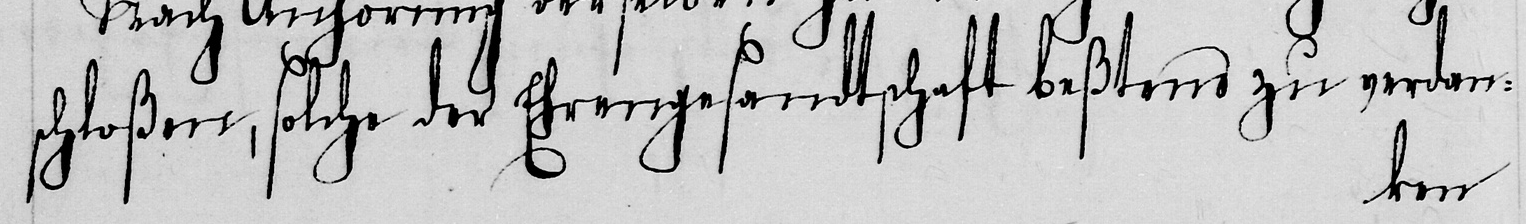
schloßen, solche der Ehrengesandtschaft beßtens zu verdan-
